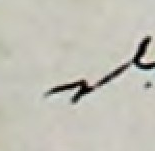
do
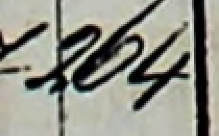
264
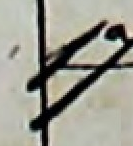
17
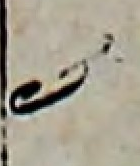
5
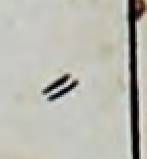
„
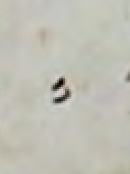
„
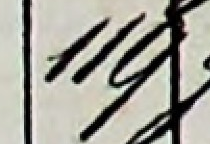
119
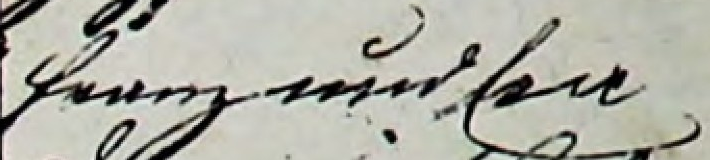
Franz und Eva
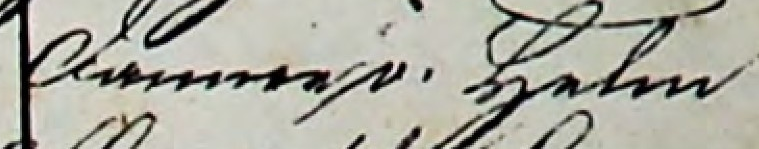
Janner v. Helm
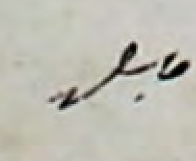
do
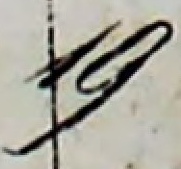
19
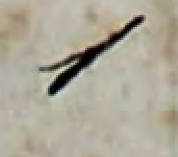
1
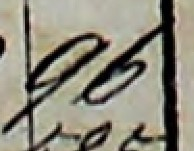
96
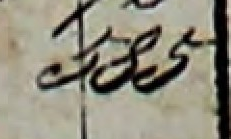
585
